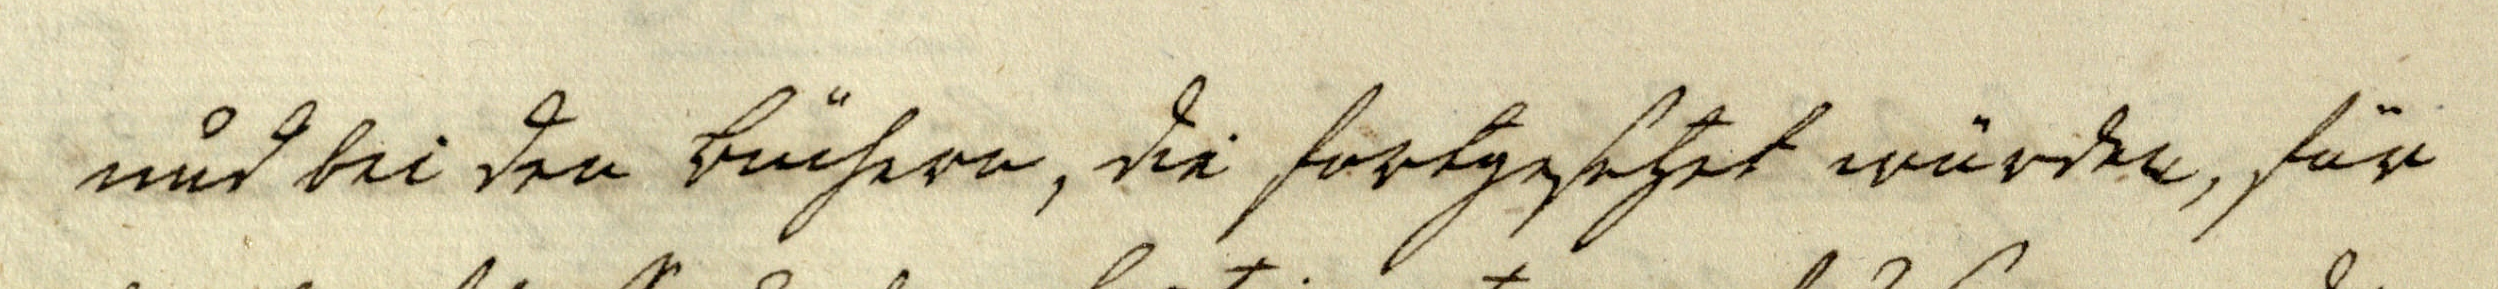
und bei den Büchern, die fortgesetzt würden, für
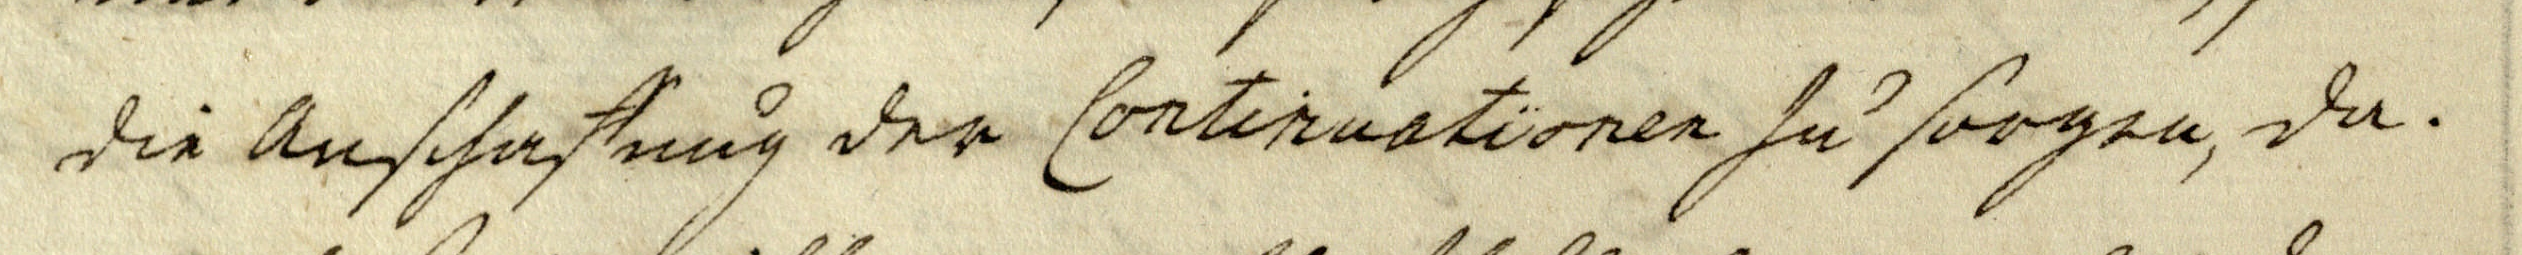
die Anschaffung der Continuationen zu sorgen, da¬
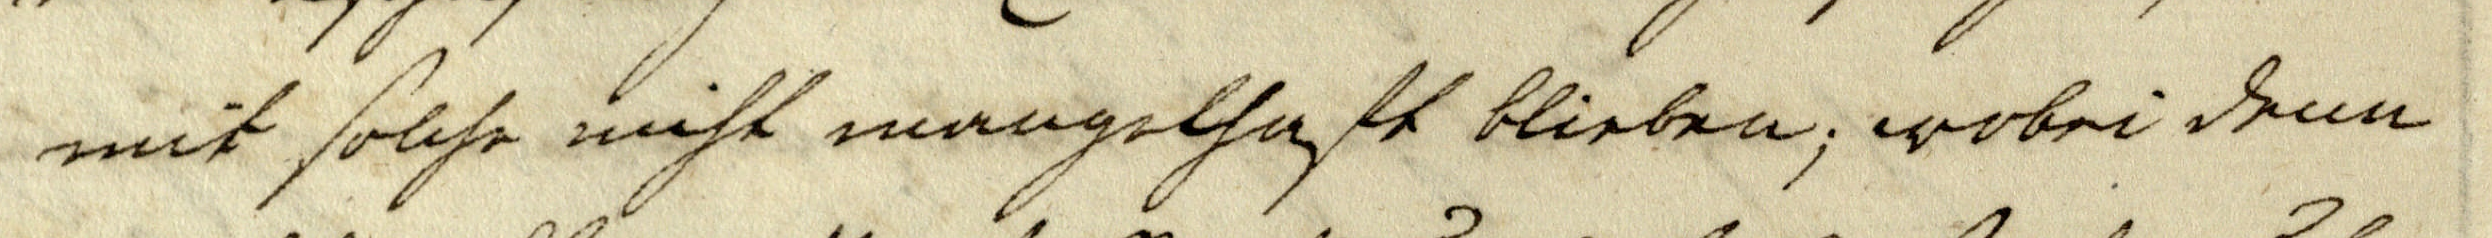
mit solche nicht mangelhaft blieben; wobei denn
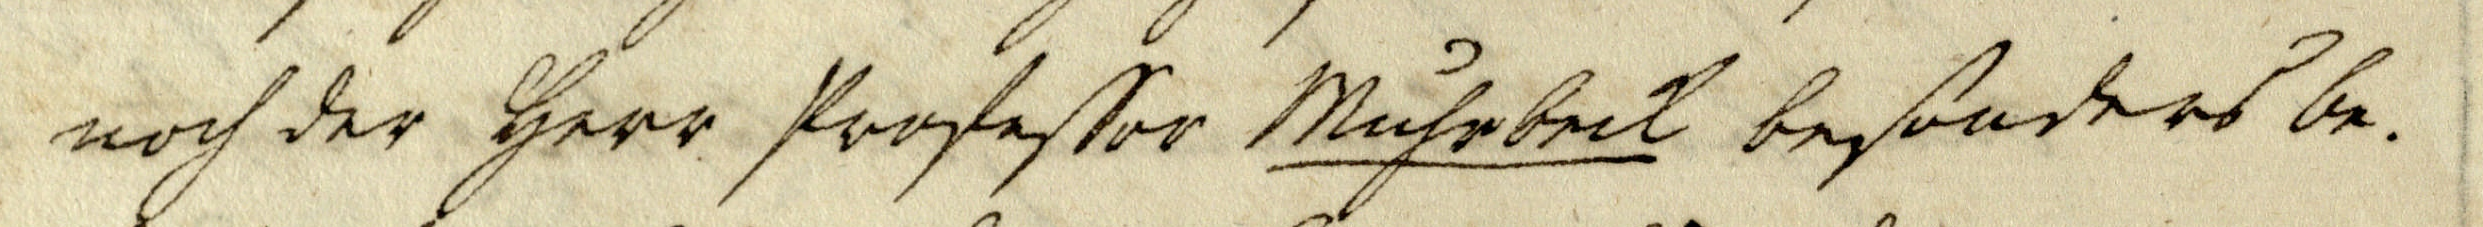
noch der Herr Professor Muhrbeck besonders be¬
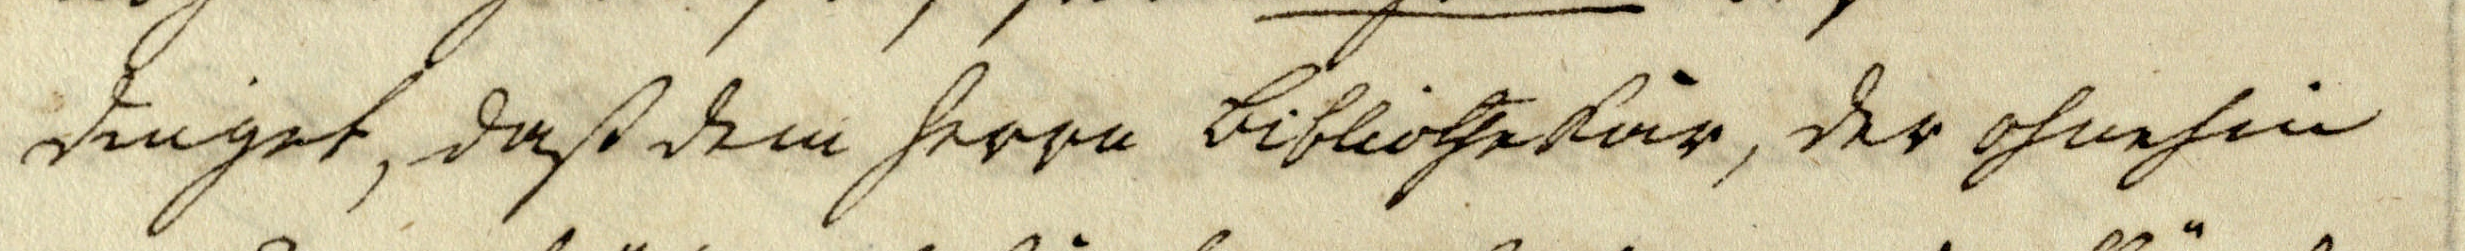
dinget, daß dem Herrn Bibliothekar, der ohnehin
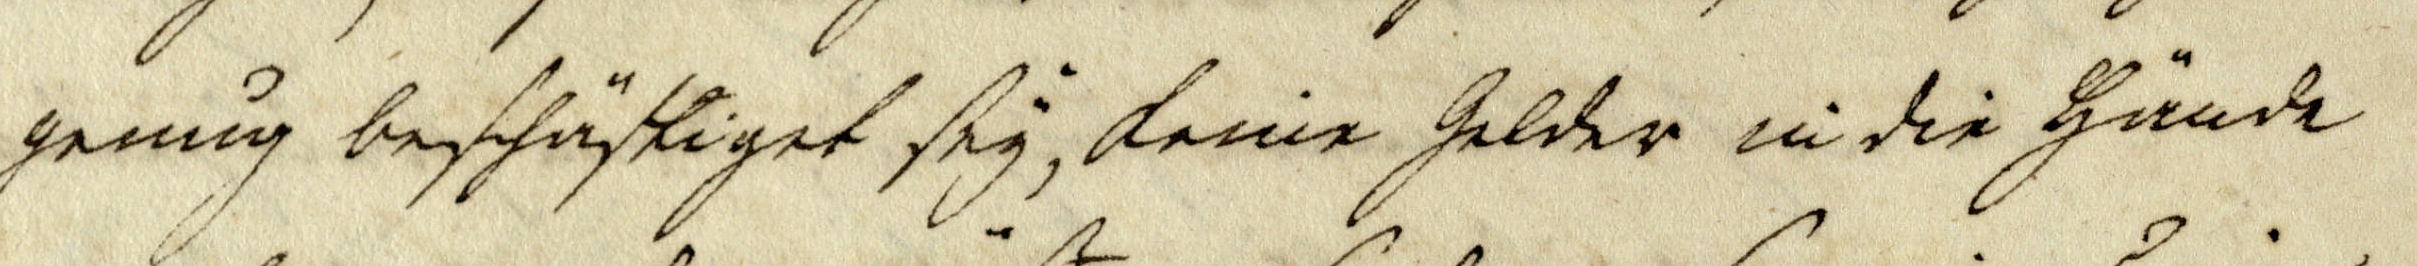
genug beschäftiget seÿ, keine Gelder in die Hände
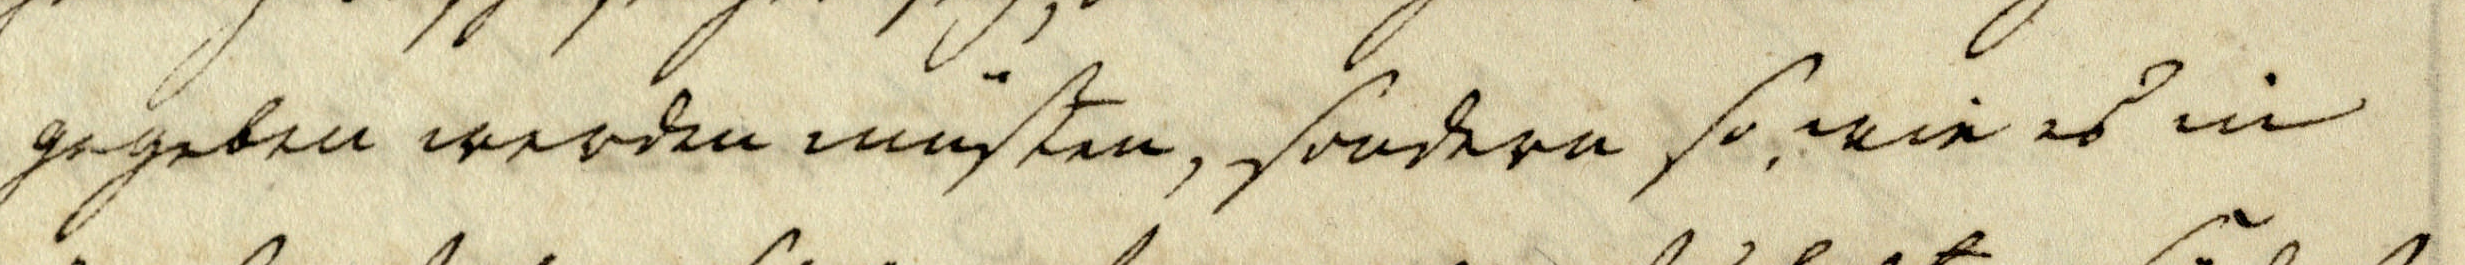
gegeben werden müßten, sondern so, wie es in
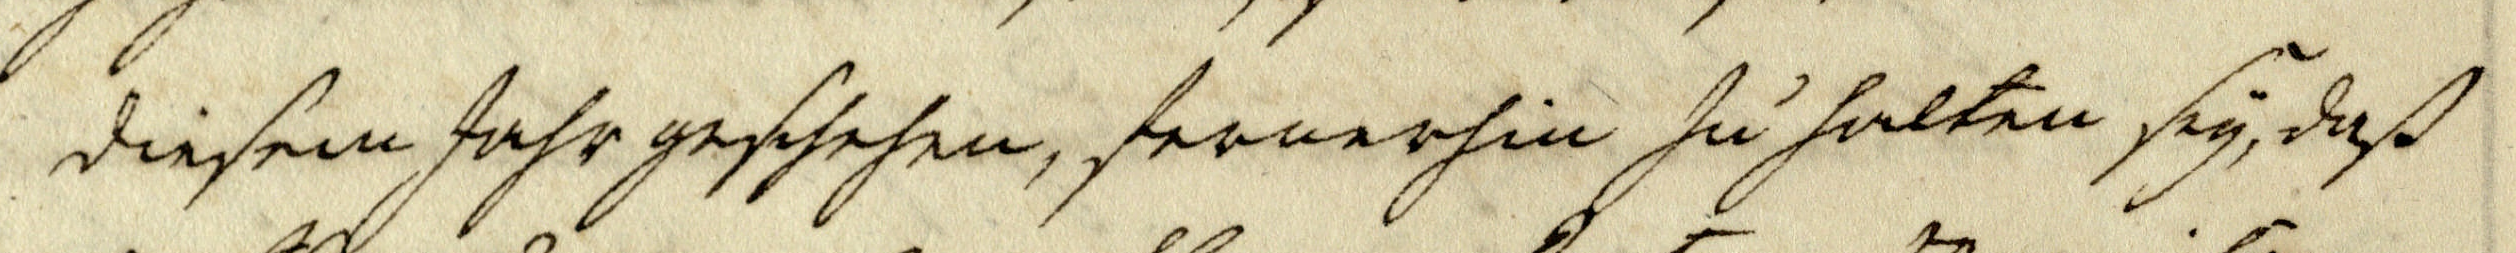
diesem Jahr geschehen, fernerhin zu halten seÿ, daß
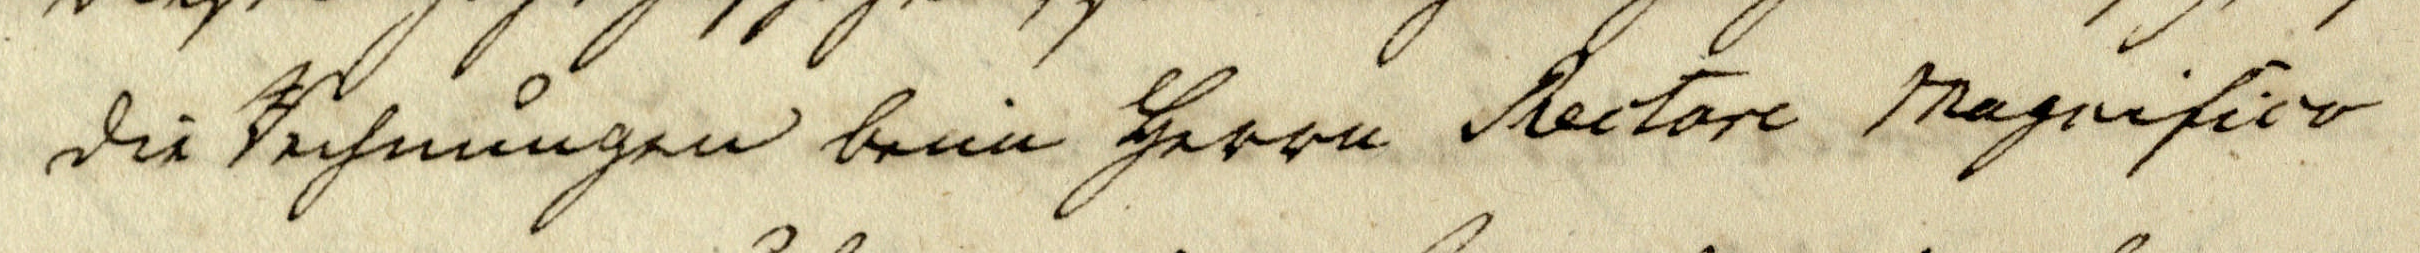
die Rechnungen beim Herrn Rectore Magnifico
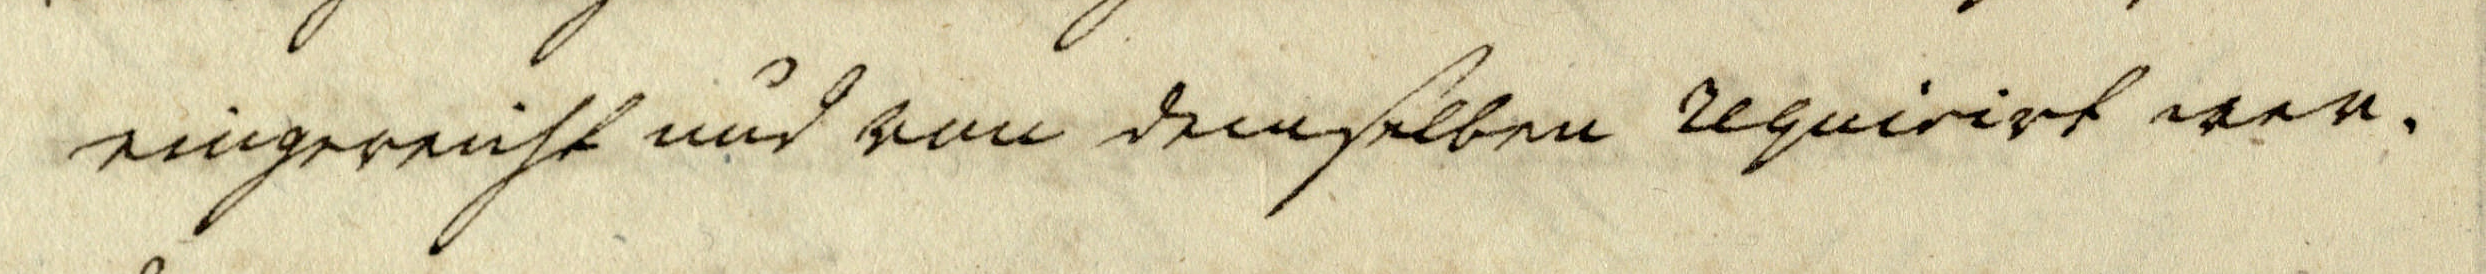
eingereicht und von demselben requirirt wer¬
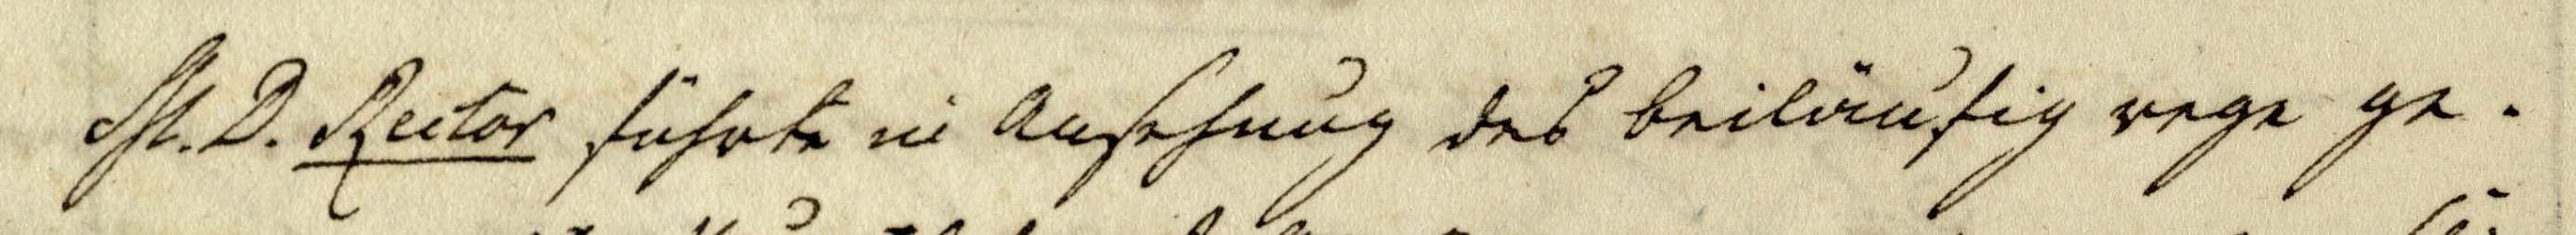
M. D. Rector führte in Ansehung des beiläufig rege ge¬
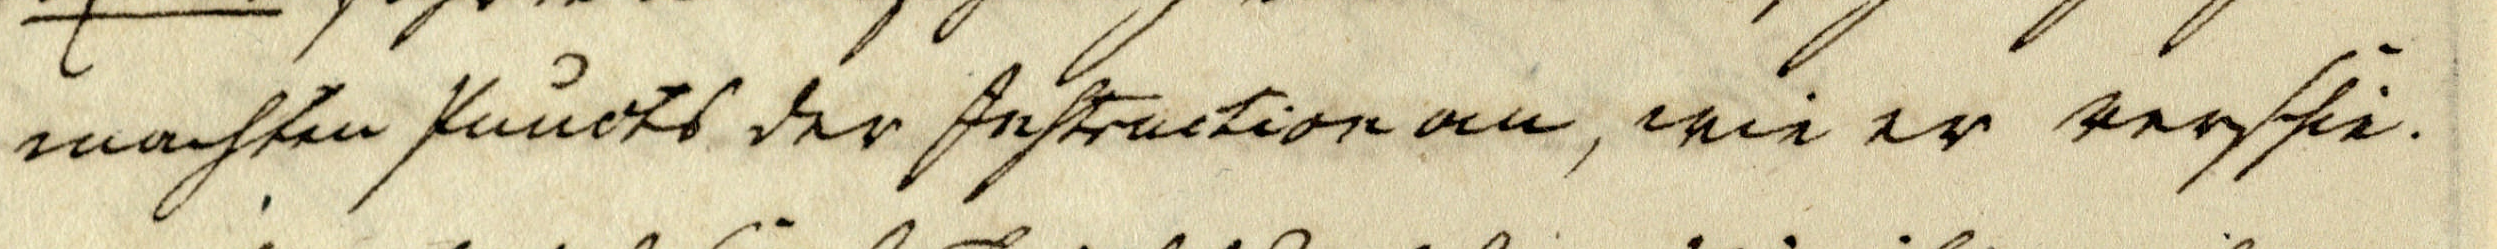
machten Puncts der Instruction an, wie er verschie¬
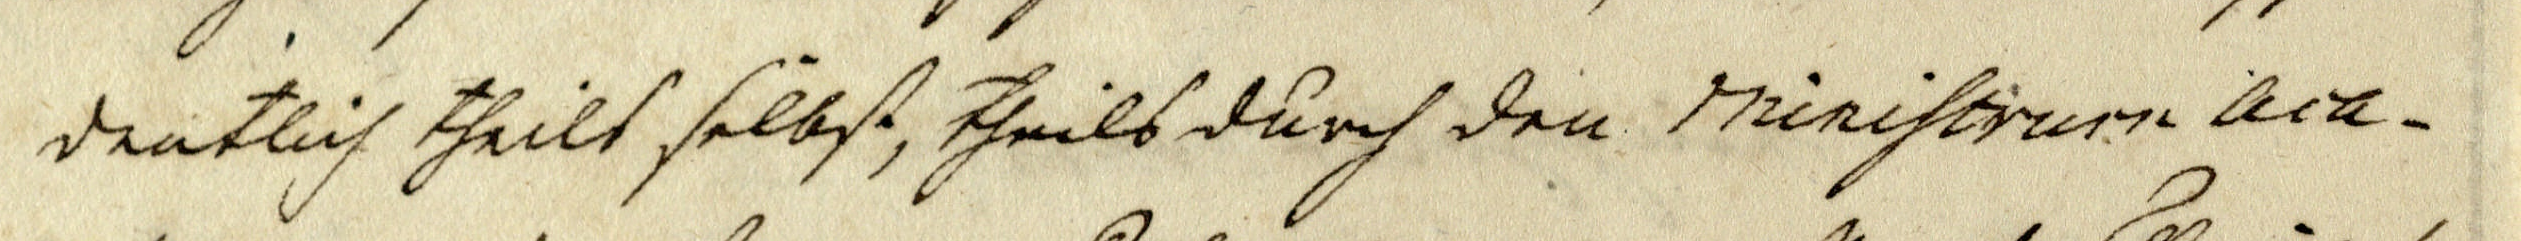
dentlich theils selbst, theils durch den Ministrum Aca¬
